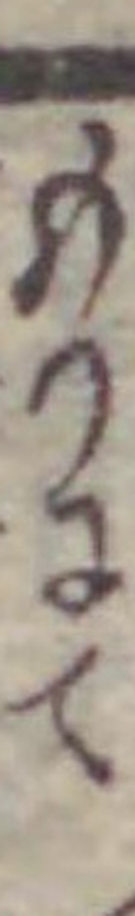もりにて
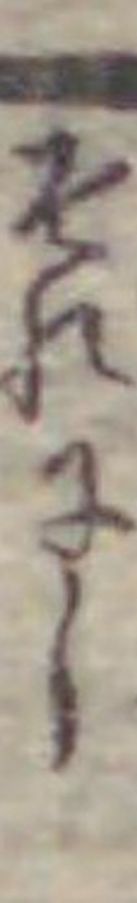それにし
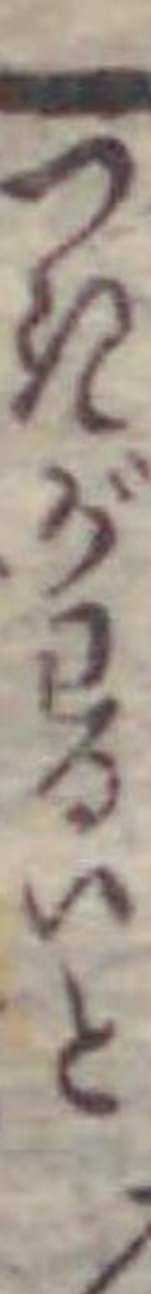つきがわるいと
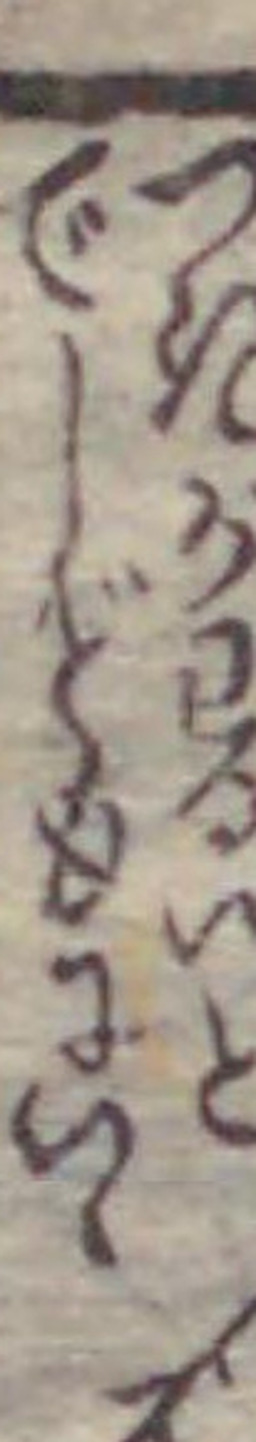でしどもにいゝ
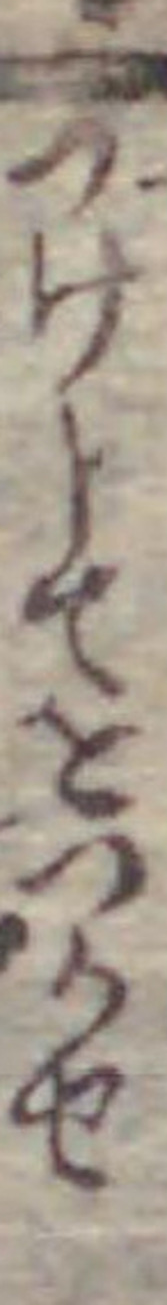つけしてをつかせ
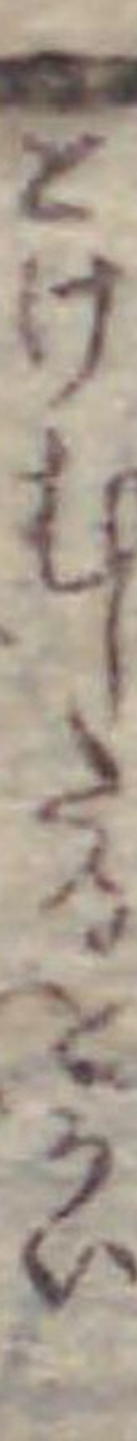こけむしたるをかい
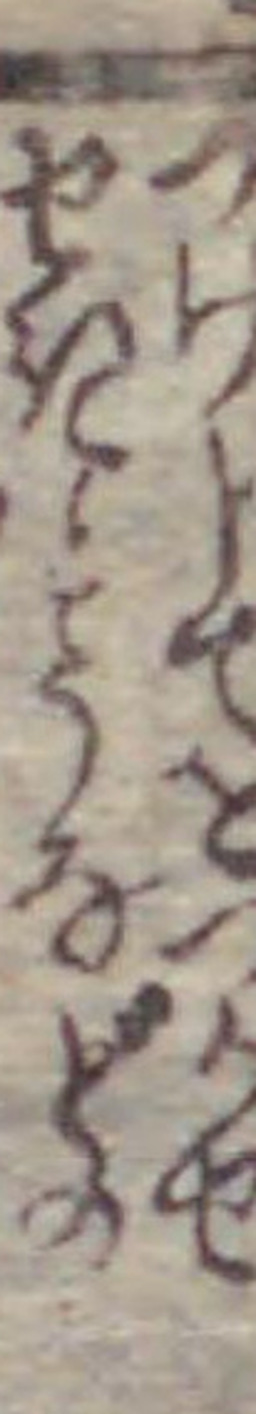せきとうなどの
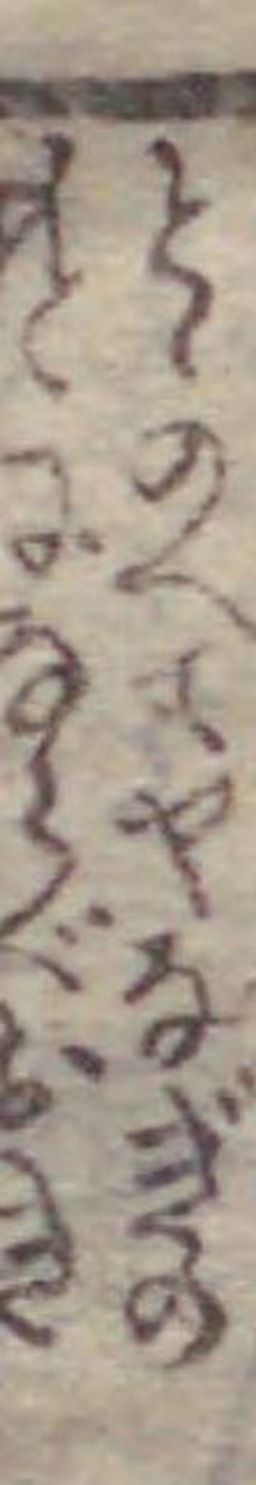もとにならべおき
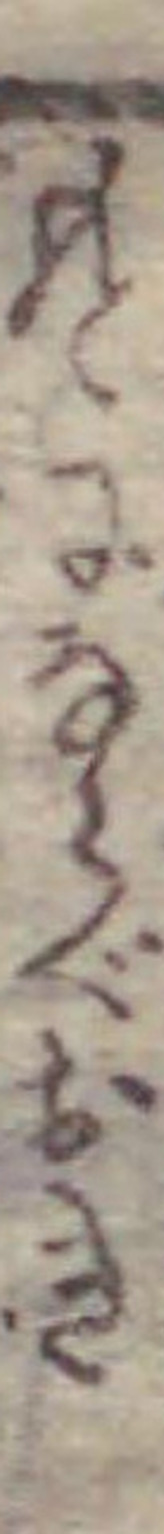もとにならべおき
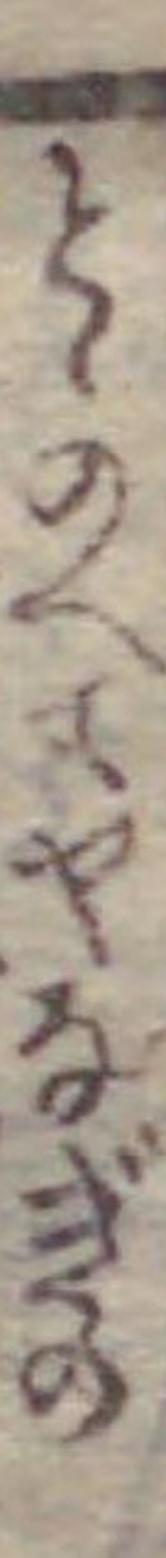とゝのへてやなぎの
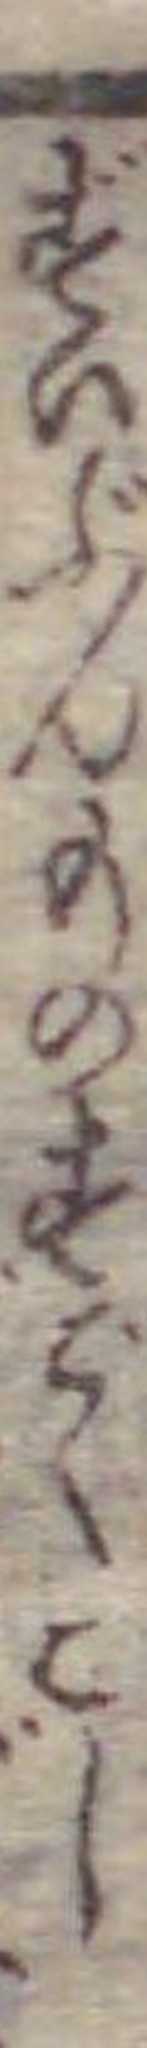ずいぶんものすごくこし
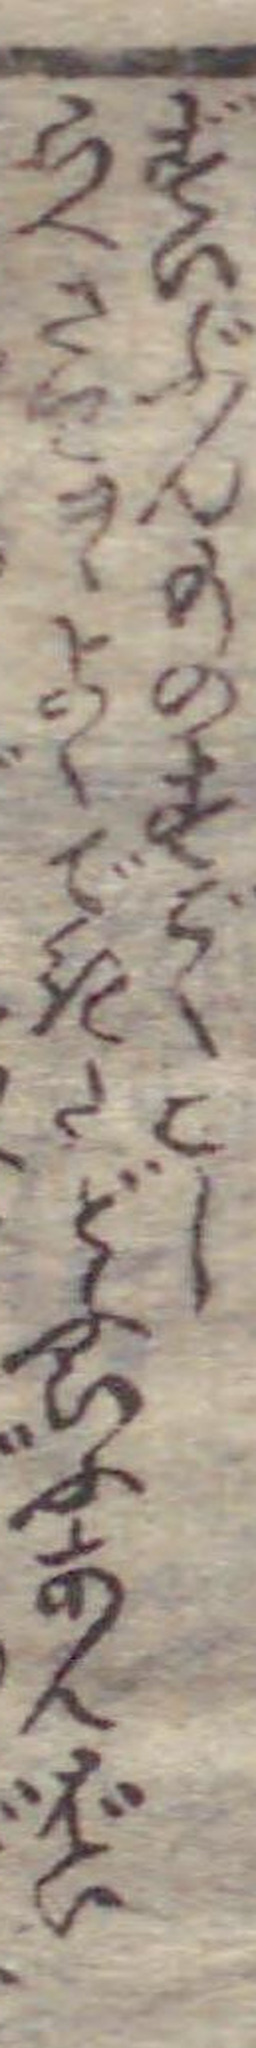らへさせてヲヽよくできたどふいふあんばい
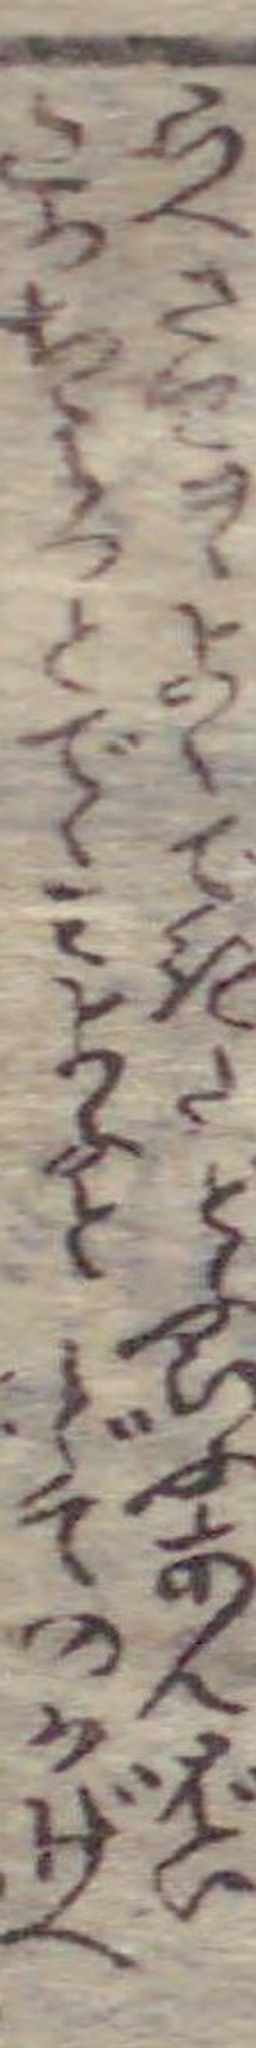たかちよつとでゝみよふとどてのかげへ
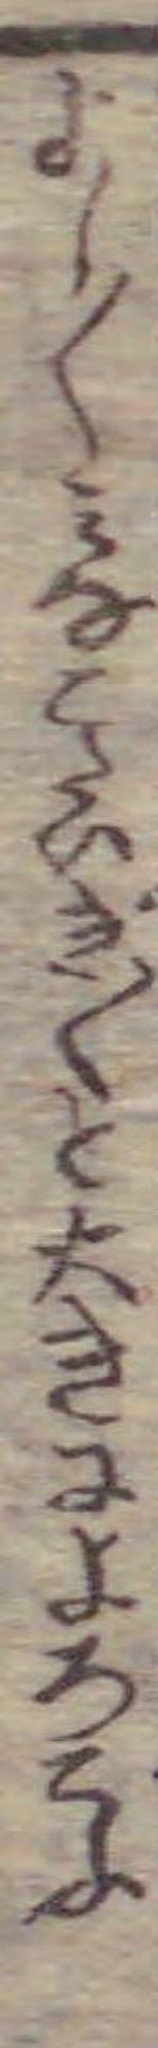よし〳〵みなこたいぎ〳〵と大きによろこふ

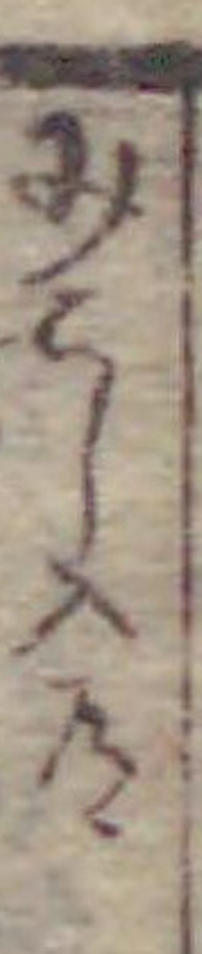みこし入道
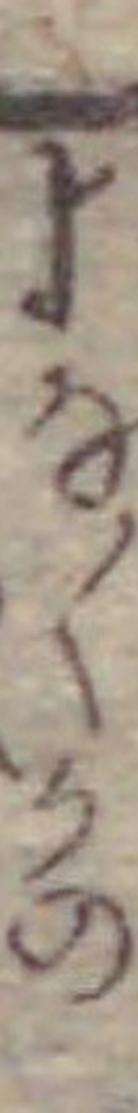よな〳〵かの
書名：化物見世開 : 2巻
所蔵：国立国会図書館 National Diet Library, JAPAN
